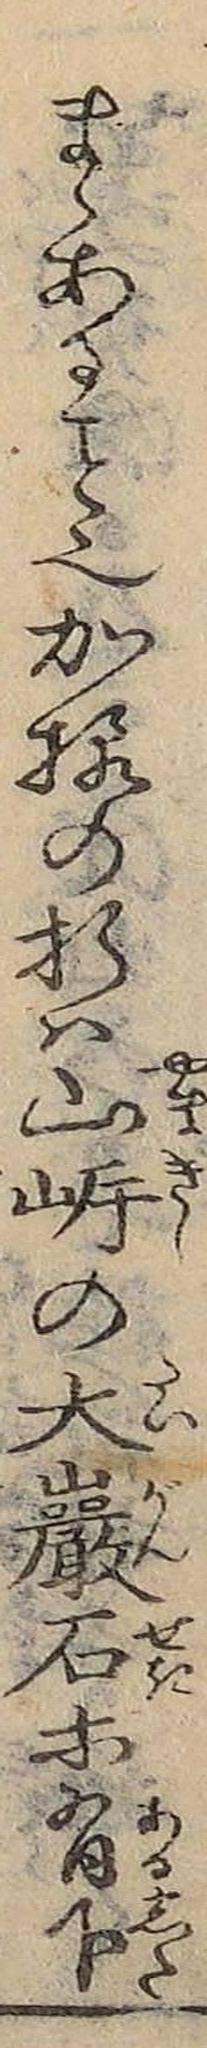まゝあること也か様の折は山岸の大巌石等有下
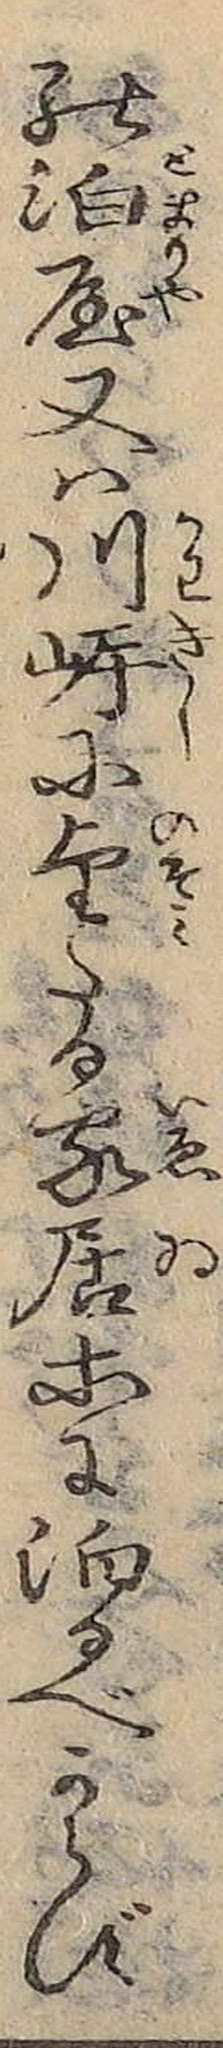の泊屋又は川岸に望たる家居等に泊るべからず
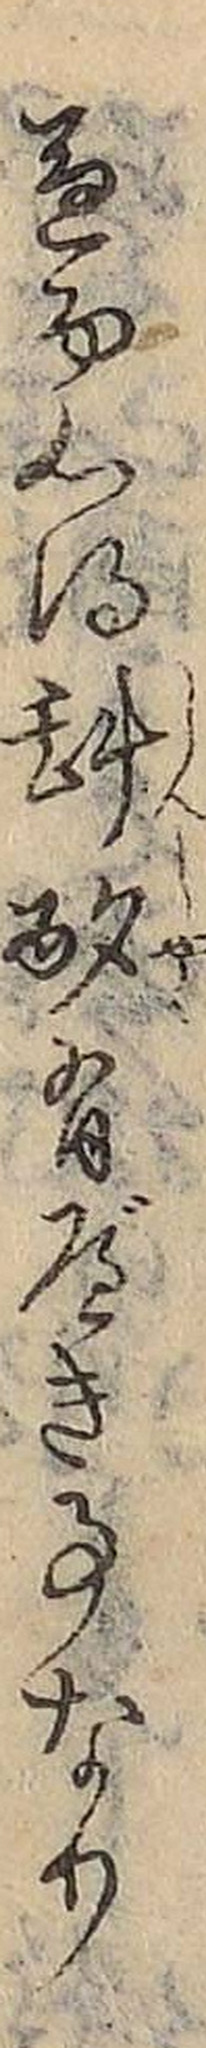兼而心得斟酌有べき事なり
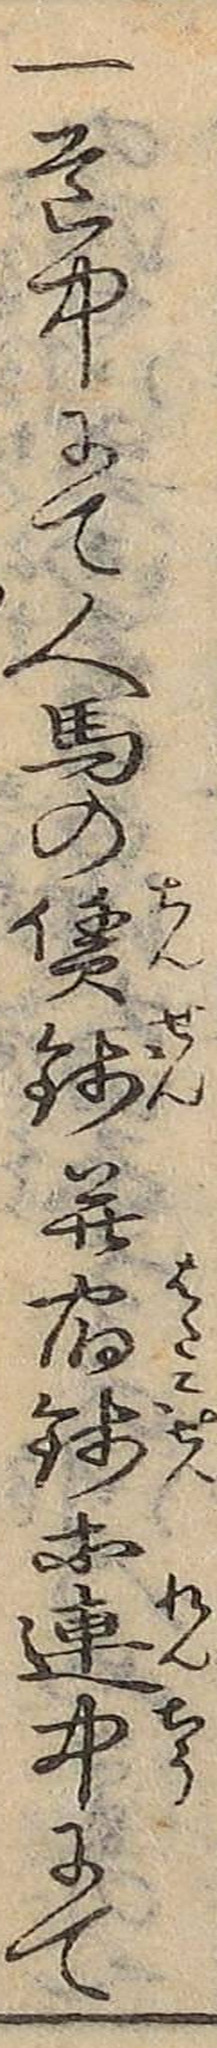一道中にて人馬の賃銭并宿銭等連中にて
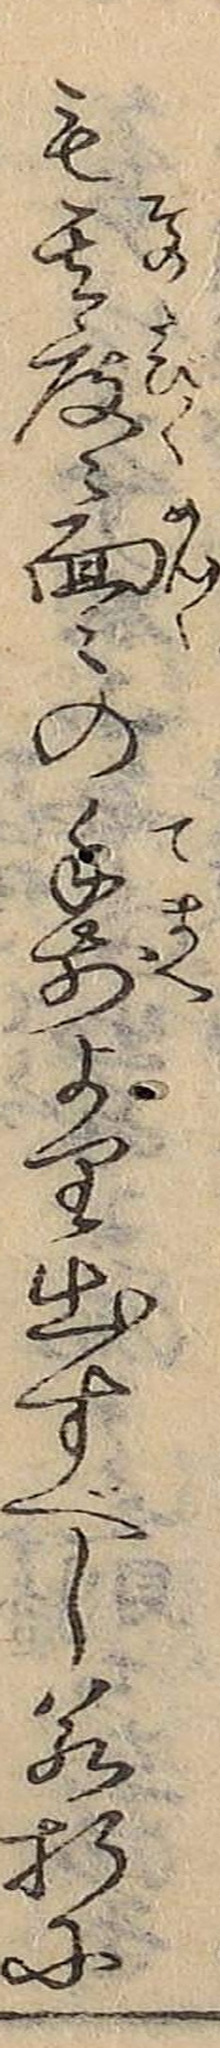も其度々面々の手前より出すべし若折に
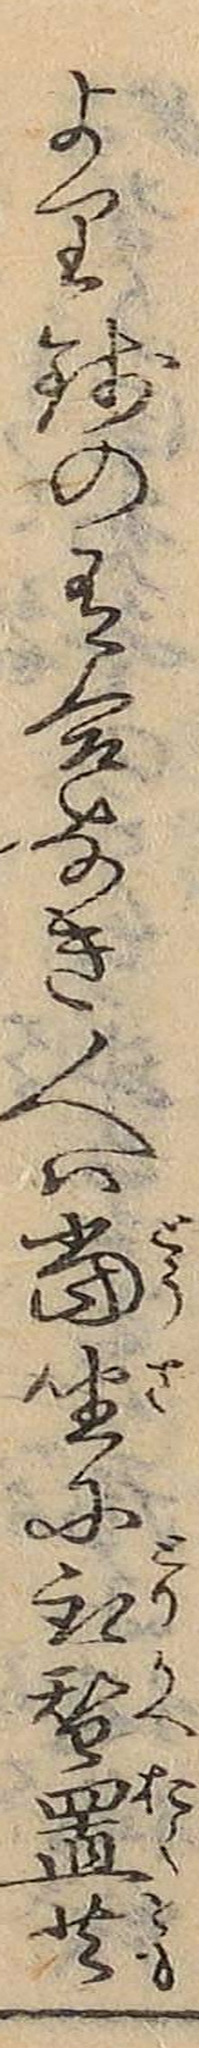より銭の有合なき人は当坐に取替置共
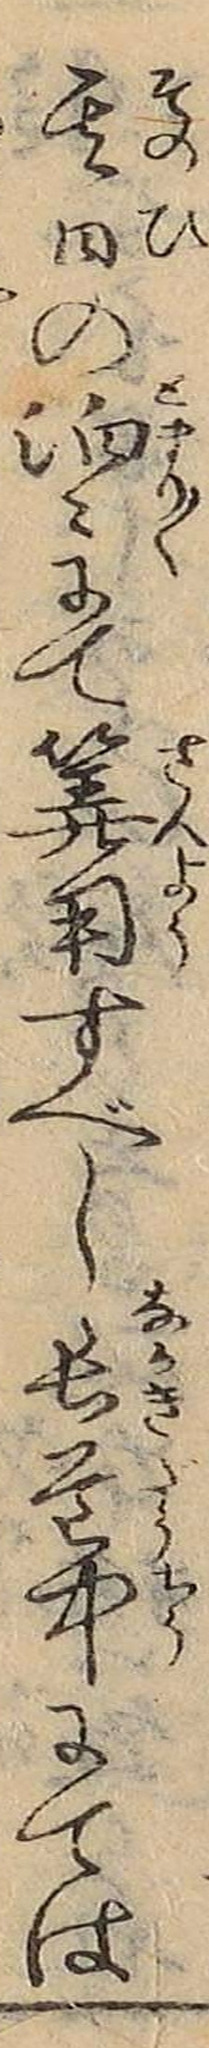其日の泊々にて算用すべし長道中にては
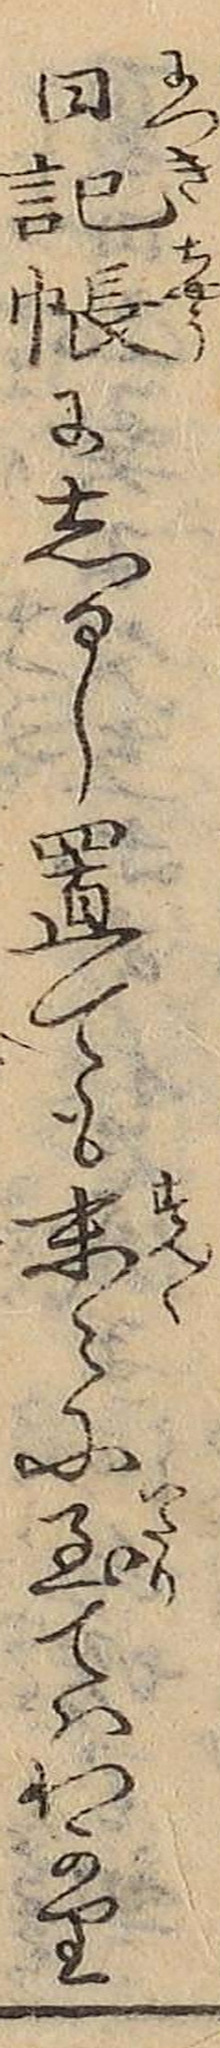日記帳にしるし置ても末々に至てはわかり
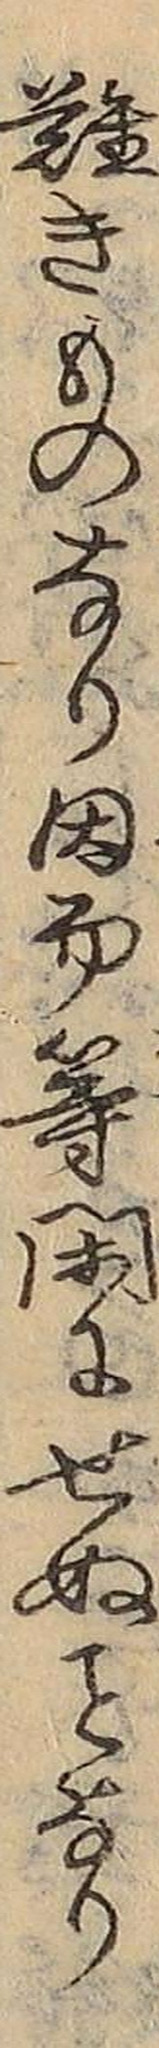難きものなり因而等閑にせぬことなり
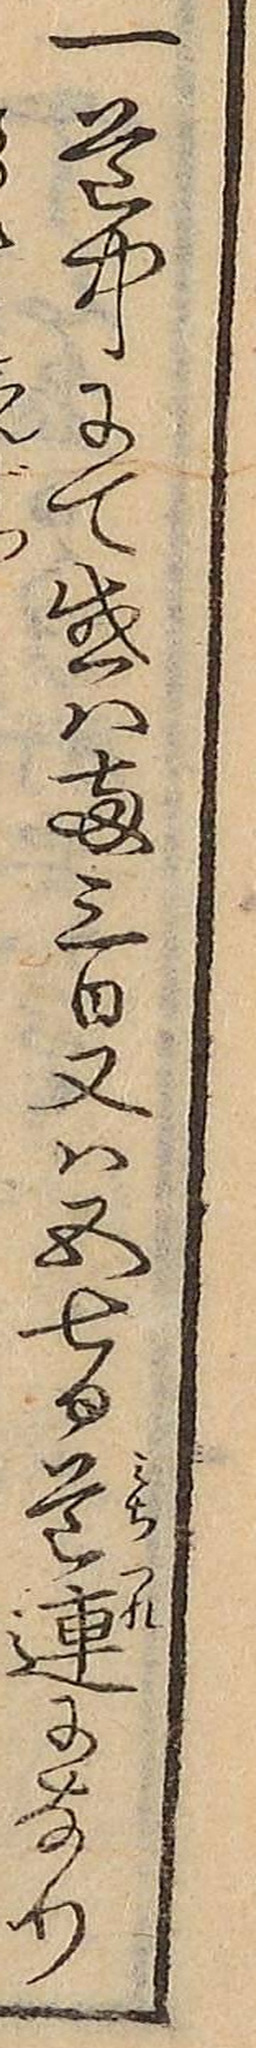一道中にて或は両三日又は五七日道連に
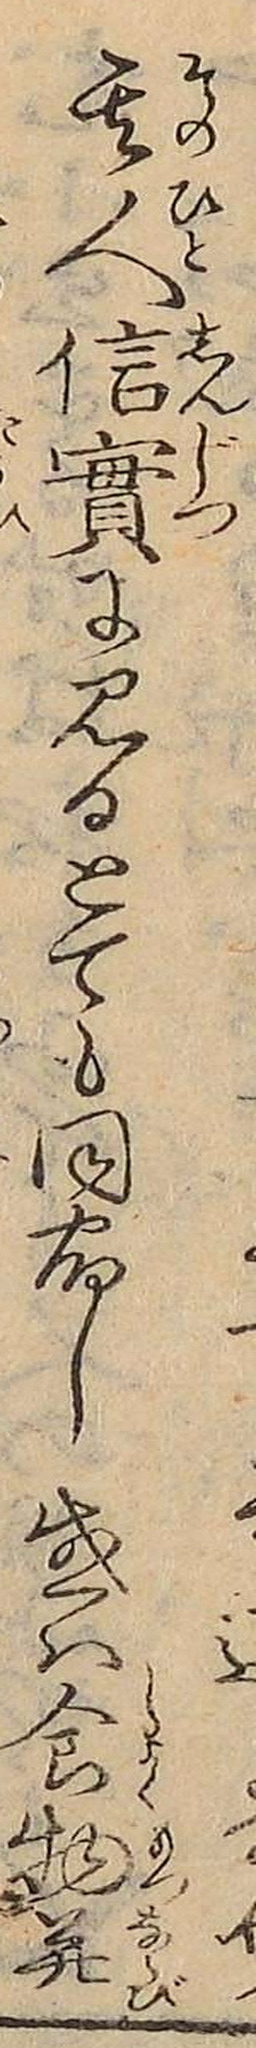其人信実に見るとても同宿し或は食物并
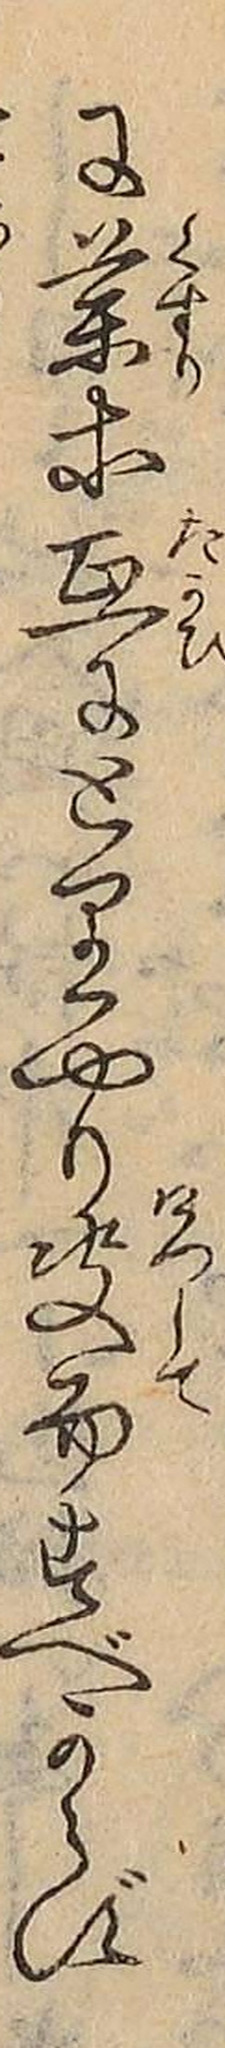に薬等互にとりやり決而すべからず
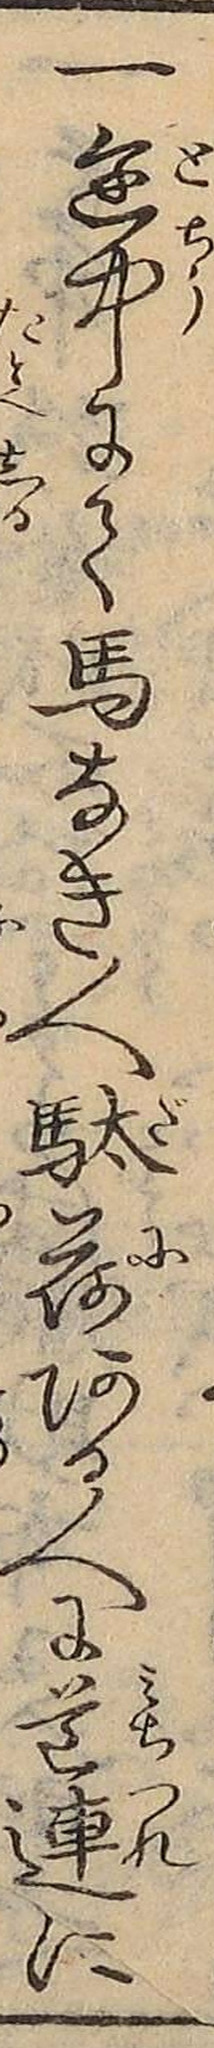一途中にて馬なき人駄荷ある人に道連に
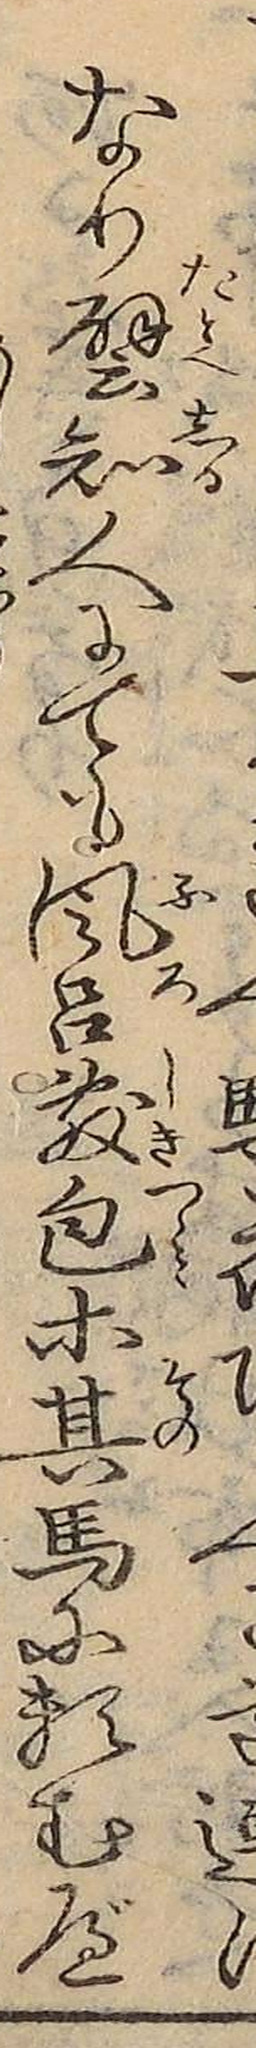なり譬知人にても風呂敷包等其馬に頼むべ
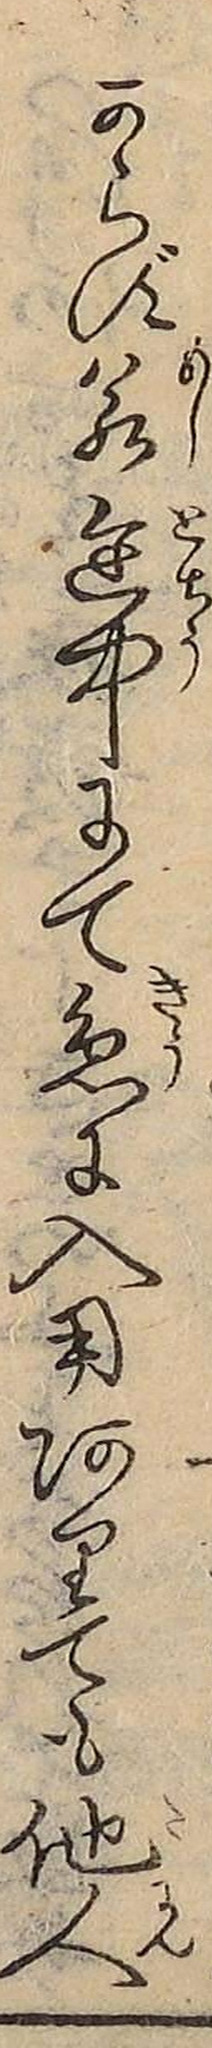からずは若途中にて急に入用ありても他人
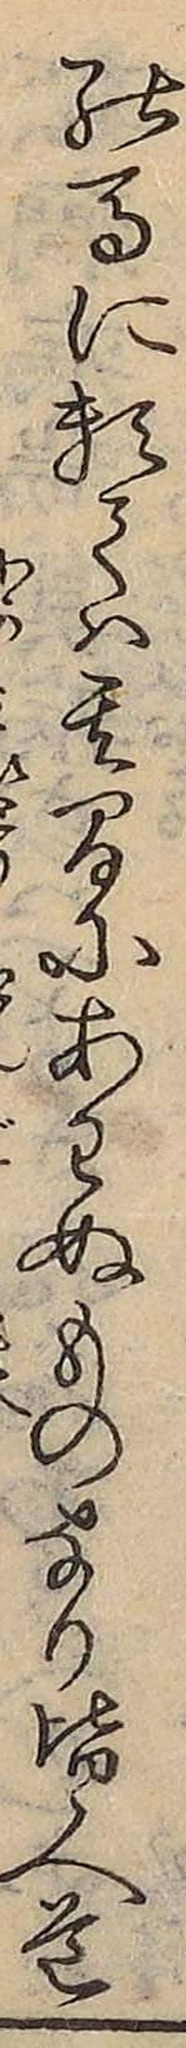の馬に頼るは其間にあわぬものなり皆人道
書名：旅行用心集
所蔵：神戸大学附属図書館 国文学研究資料館
